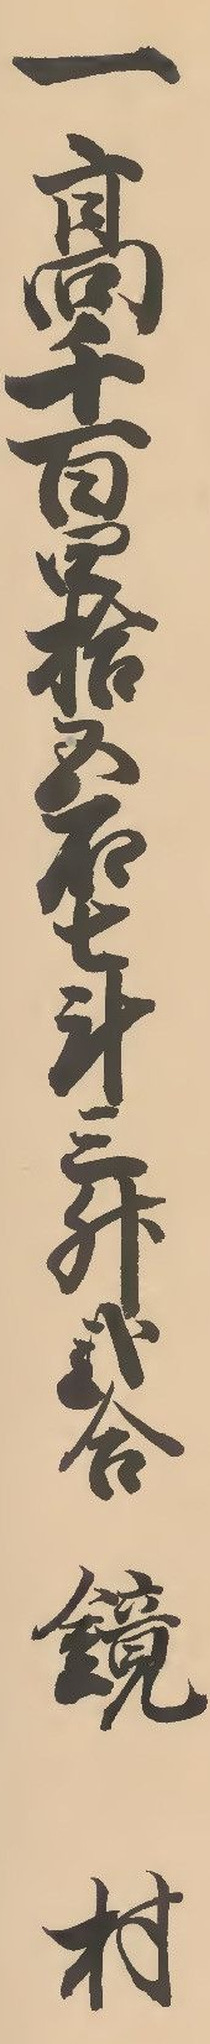一髙千百四拾五石七斗三升弐合鏡村
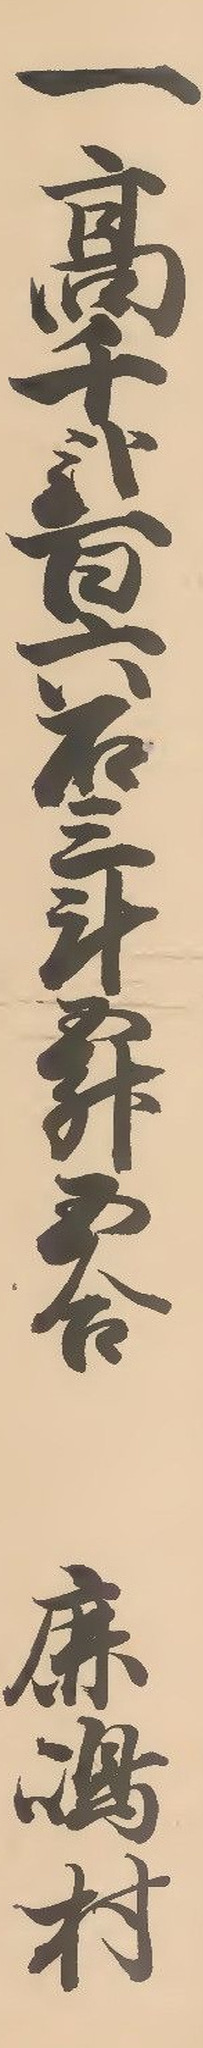一髙千二百六石三斗五升五合鹿嶋村
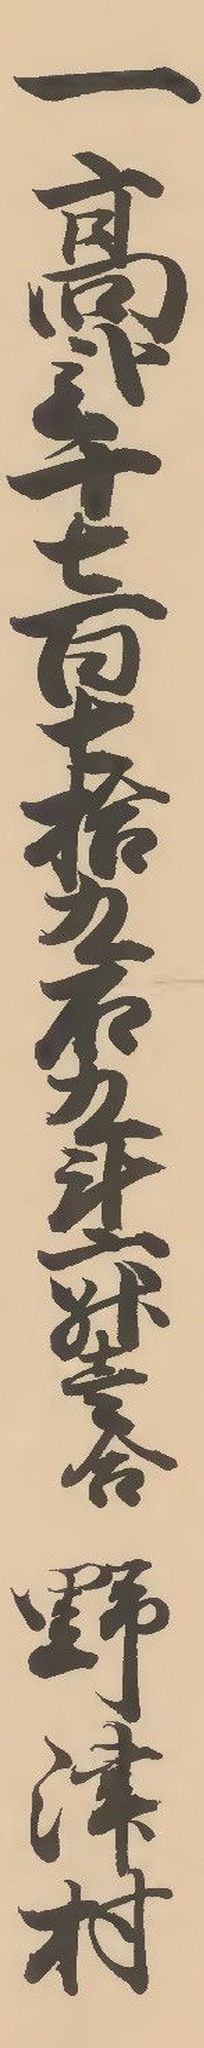一髙弐千七百七拾九石九斗六升壱合野津村
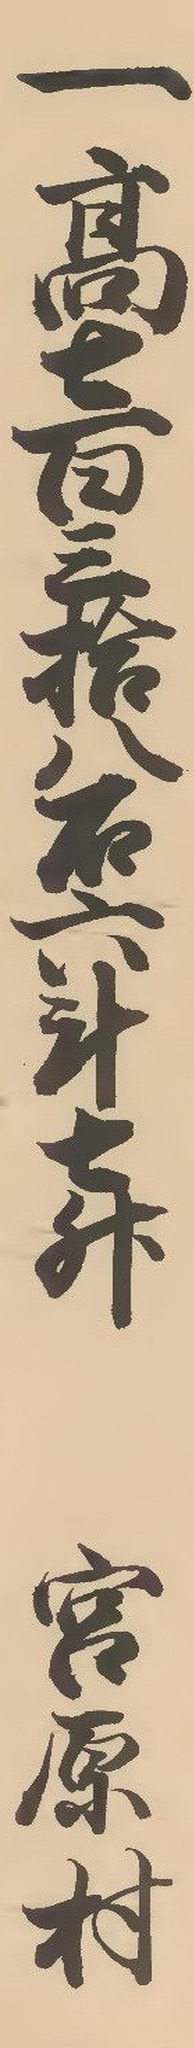一髙七百三拾八石六斗七升宮原村
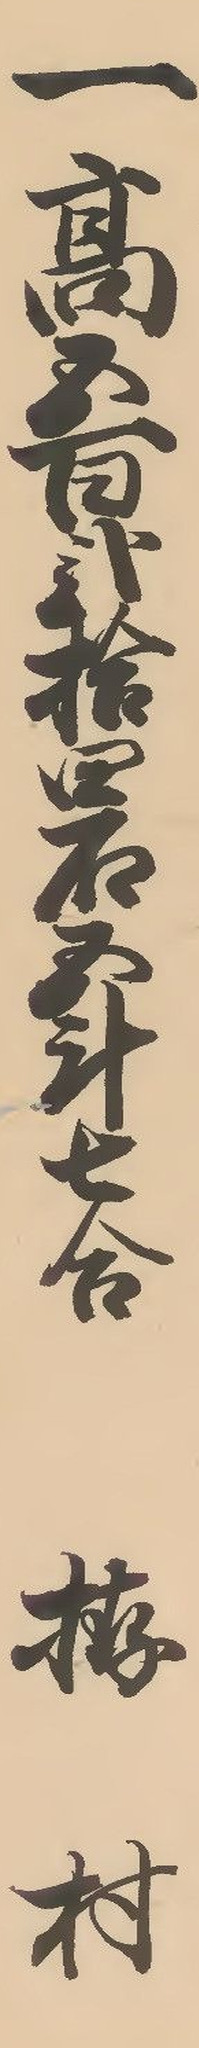一髙五百弐拾四石五斗七合拵村

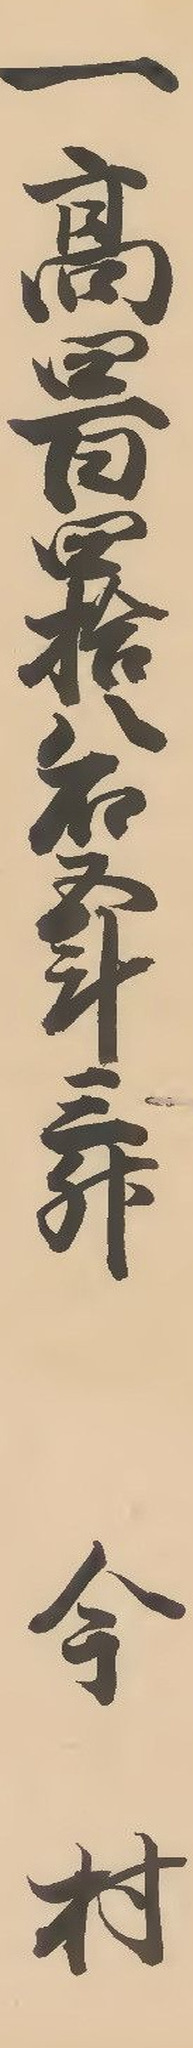一髙四百四拾八石五斗三升今村
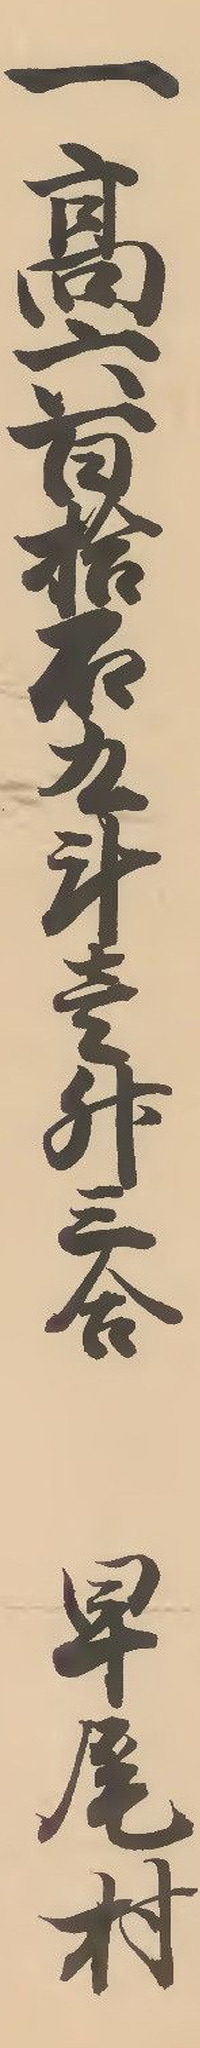一髙六百拾石九斗壱升三合早尾村
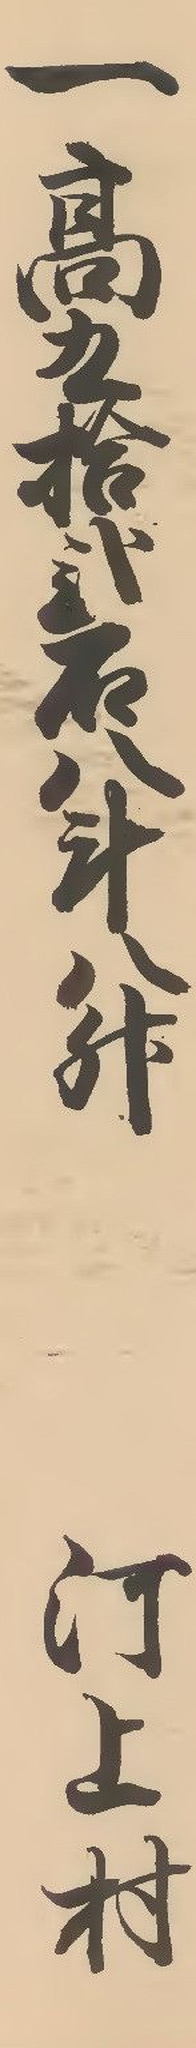一髙九拾弐石八斗八升河上村
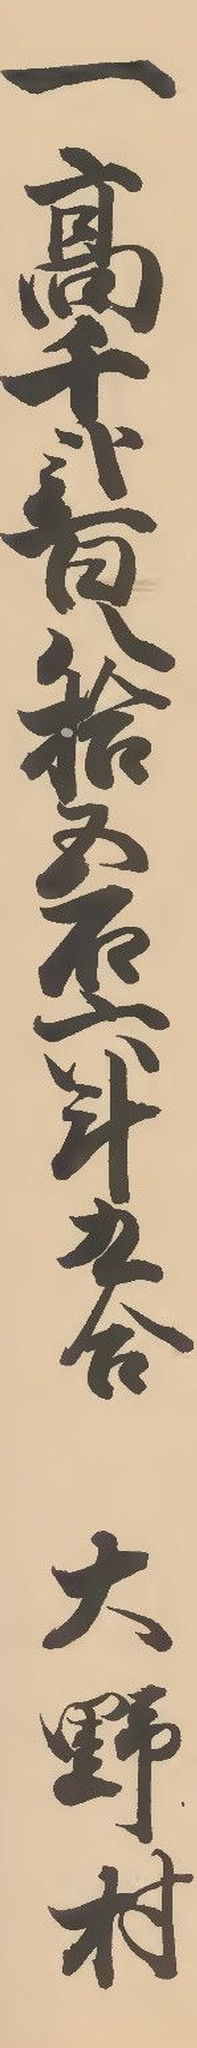一髙千弐百八拾五石六斗九合大野村
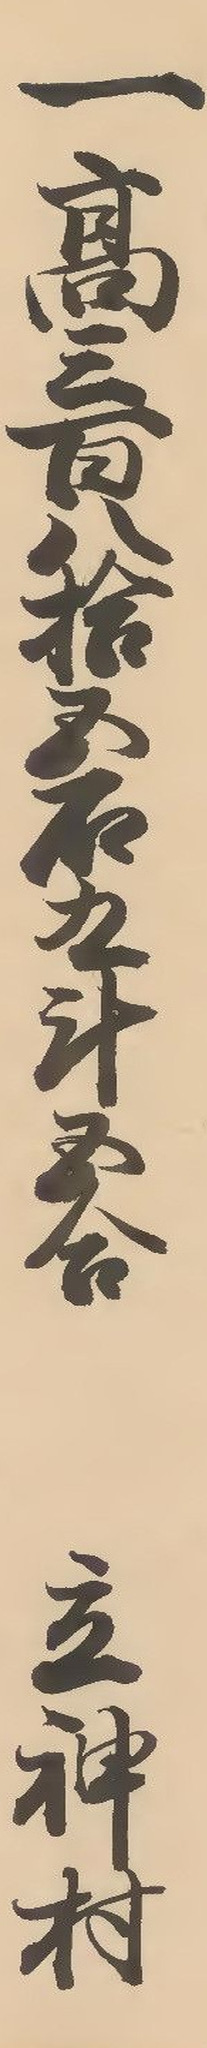一髙三百八拾五石九斗五合立神村
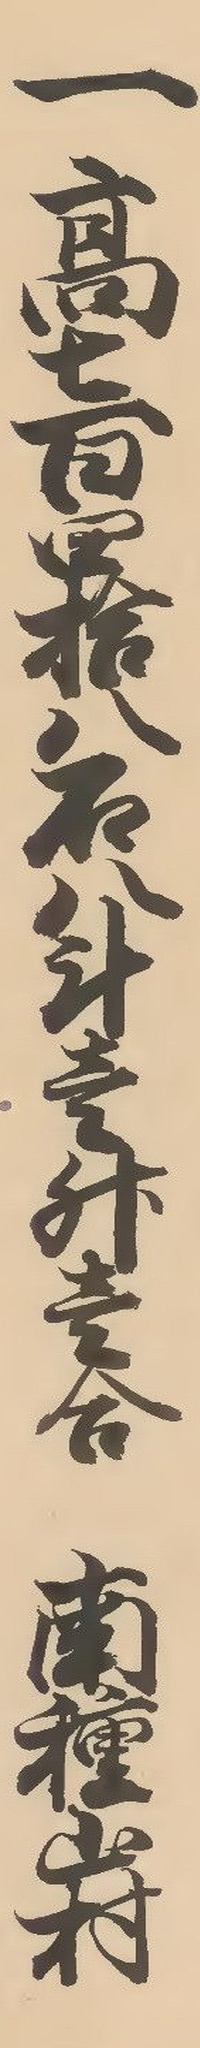一髙七百四拾八石八斗壱升壱合南種山村
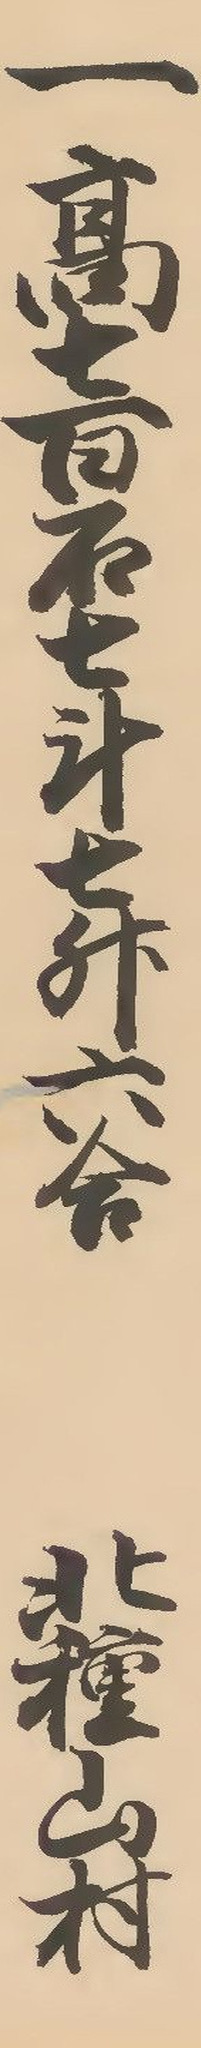一髙七百石七斗七升六合北種山村

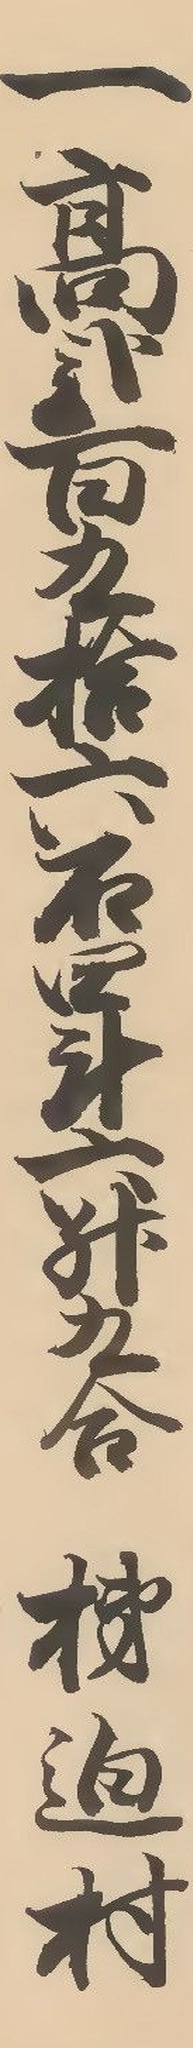一髙弐百九拾六石四斗六升九合柿迫村
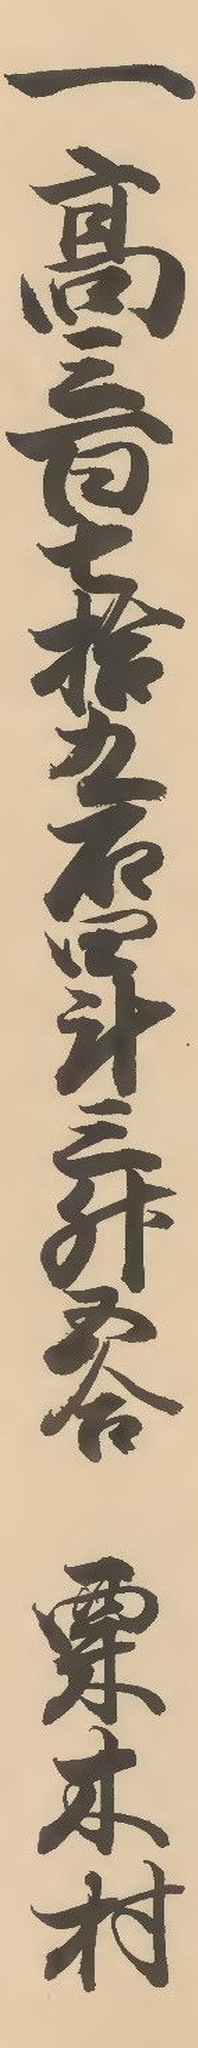一髙三百七拾九石四斗三升五合栗木村
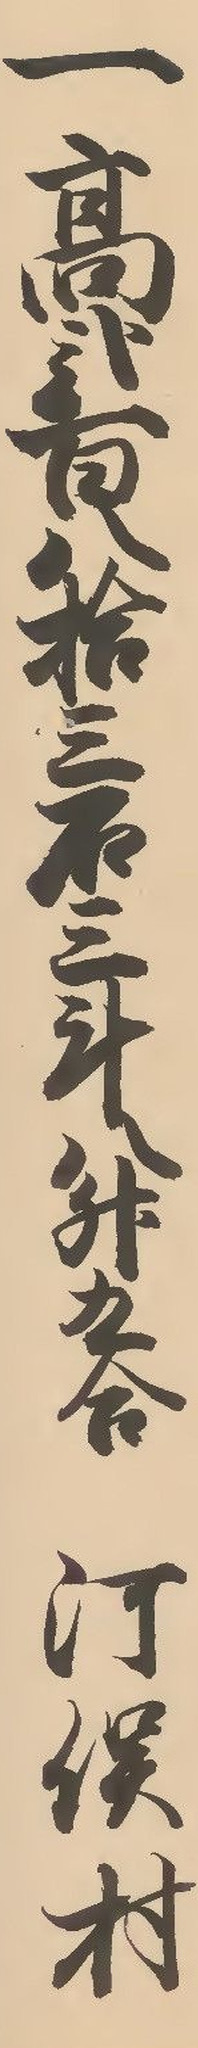一髙弐百八拾三石三斗八升九合河俣村
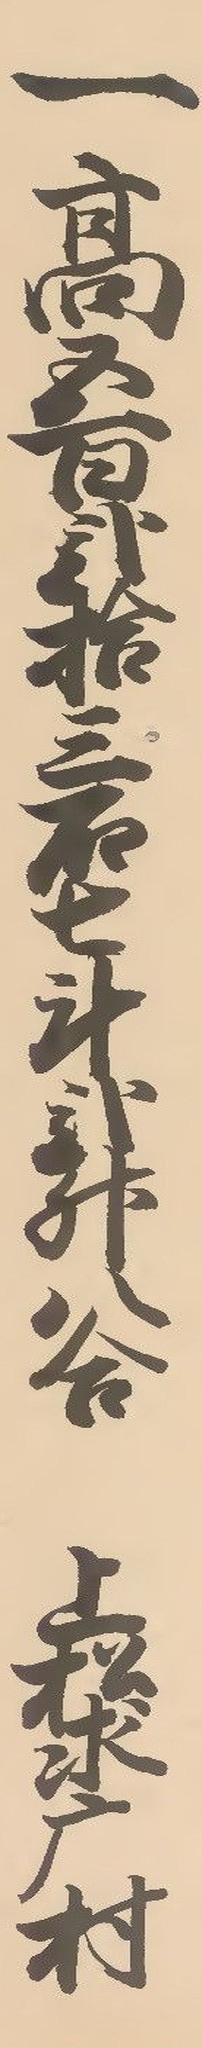一髙五百弐拾三石七斗弐升八合上松求摩村
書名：肥後国郷帳
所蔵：国立公文書館 National Archives of Japan
